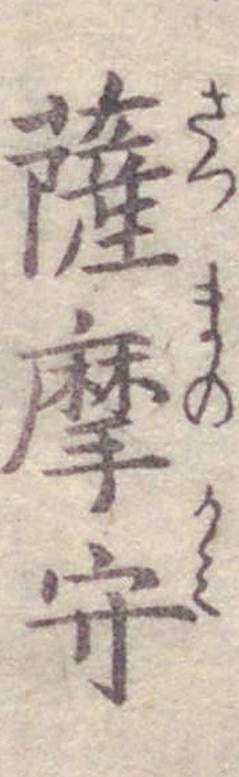薩摩守

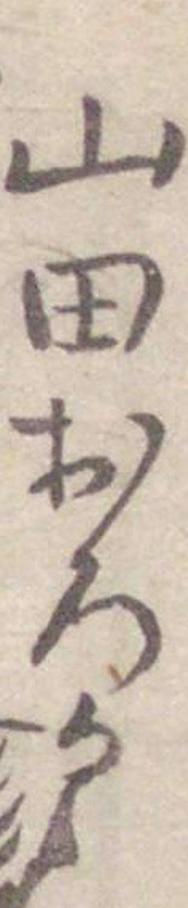山田おろか
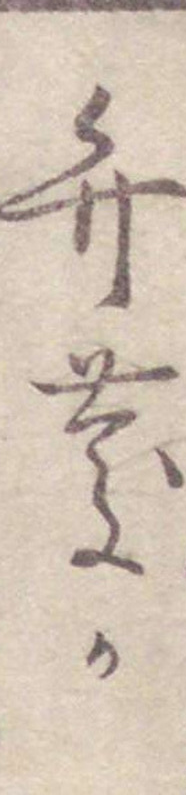弁慶か
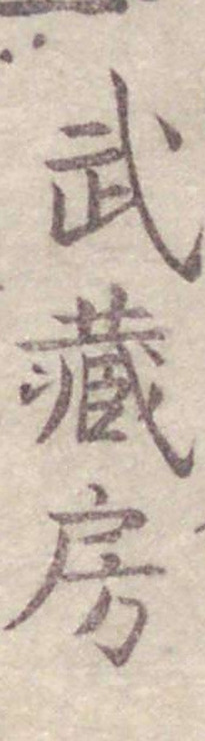武蔵坊
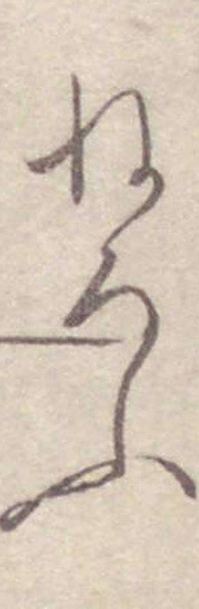ねろふ
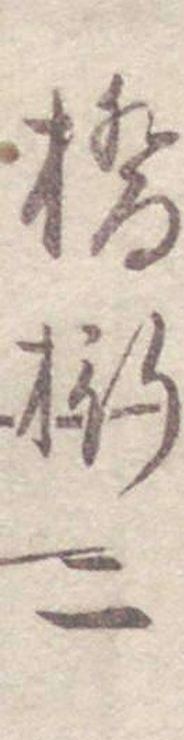橋桁二
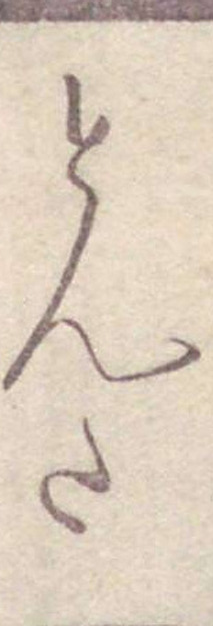とんた
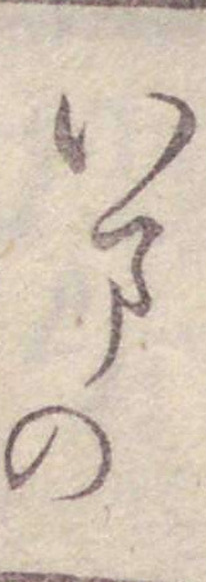いまの
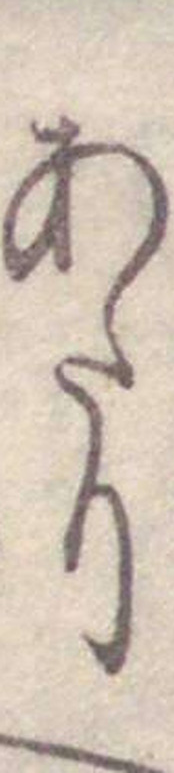あたり
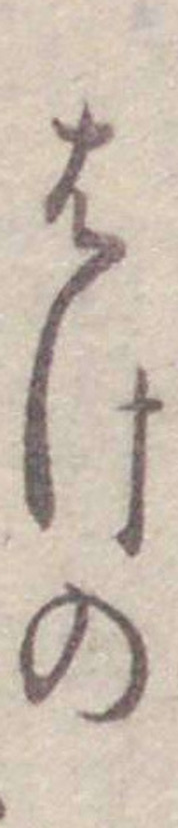はけの
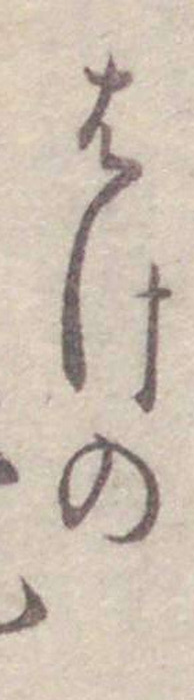はけの

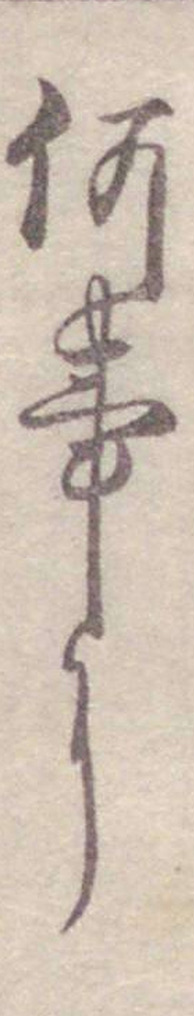何事に
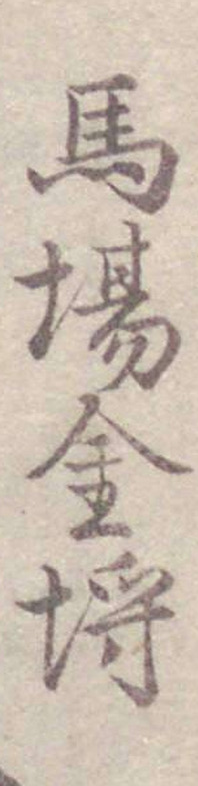馬場金埓
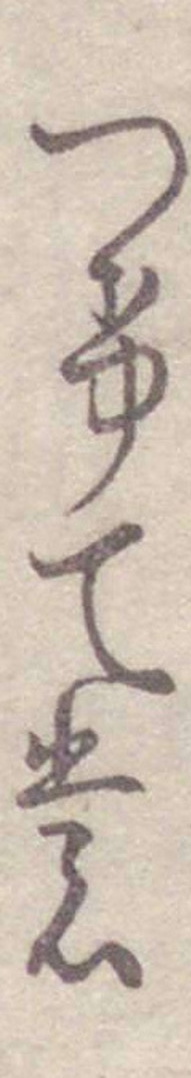つけても
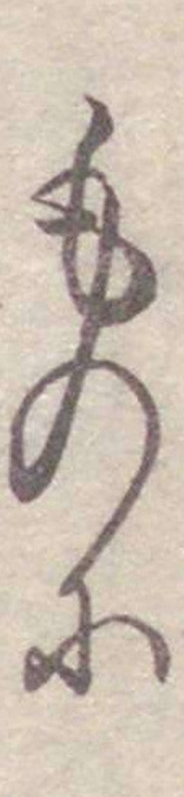ものに
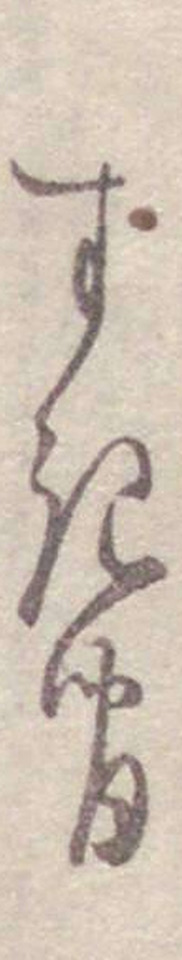すき間
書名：繪本八十宇治川
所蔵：九州大学中央図書館 国文学研究資料館
